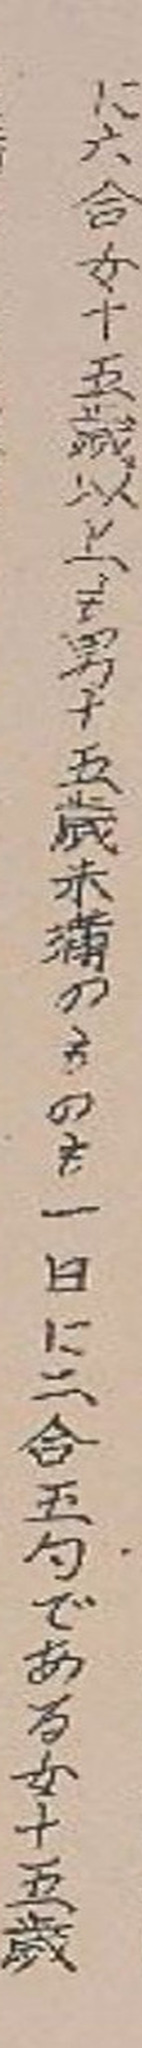に六合女十五歳以上も男十五歳未満のものも一日に二合五勺である女十五歳
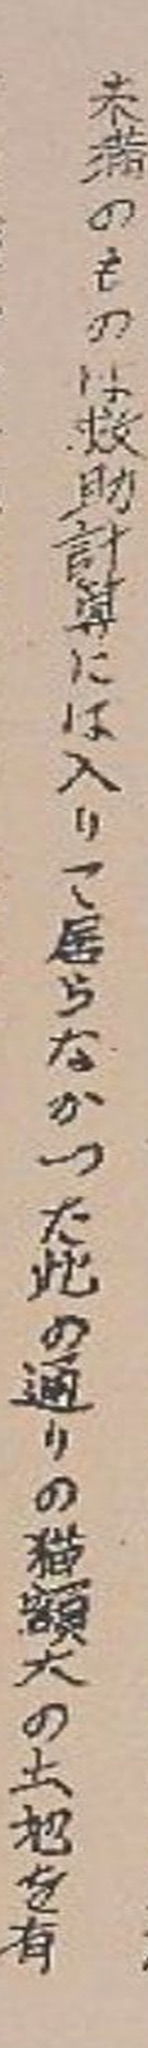未満のものは救助計算には入りて居らなかつた此の通りの猫額大の土地を有
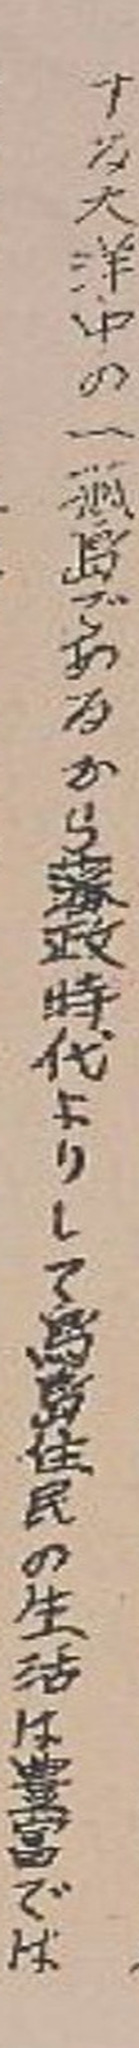する大洋中の一孤島であるから藩政時代よりして鳥島住民の生活は豊富では
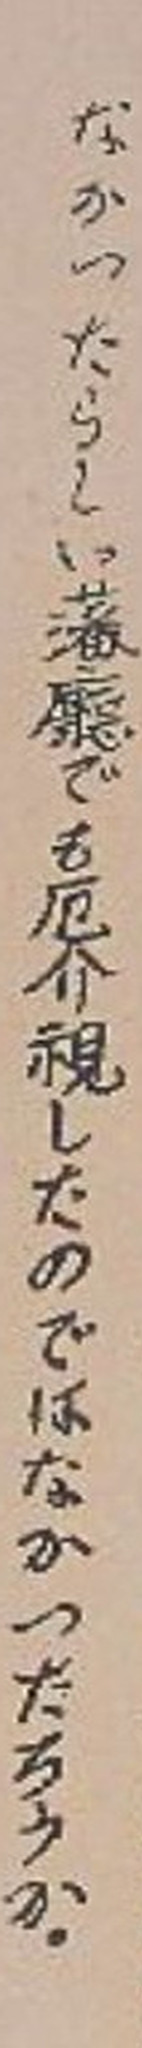なかつたらしい藩庁でも厄介視したのではなかつたろうか。

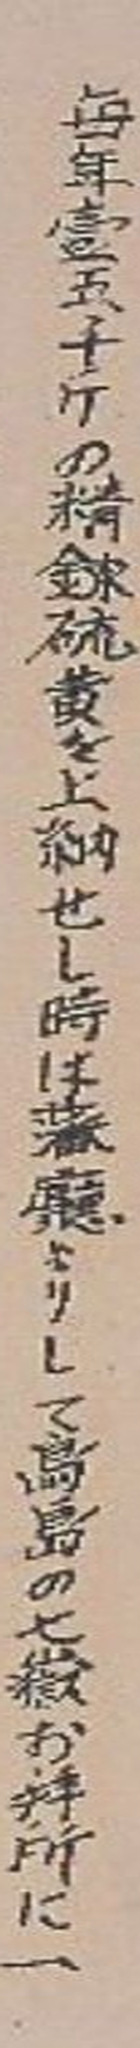毎年壱五千斤の精錬硫黄を上納せし時は藩庁よりして鳥島の七嶽お拝所に一
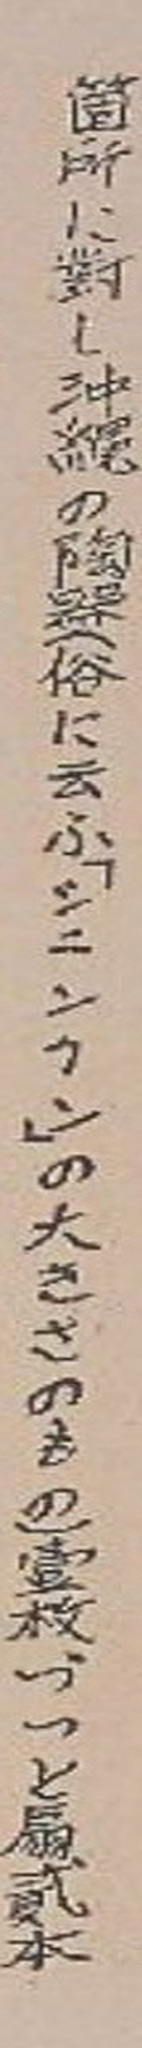箇所に対し沖縄の陶器(俗に云ふ「シニンクン」の大きさのもの)壱枚づつと扇弐本
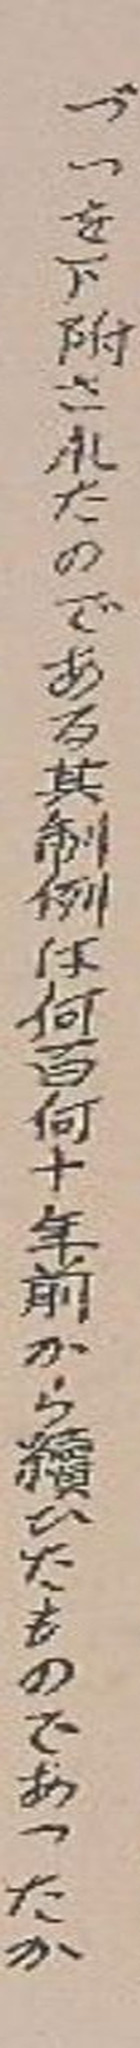づつを下附されたのである其制例は何百何十年前から続ひたものであつたか
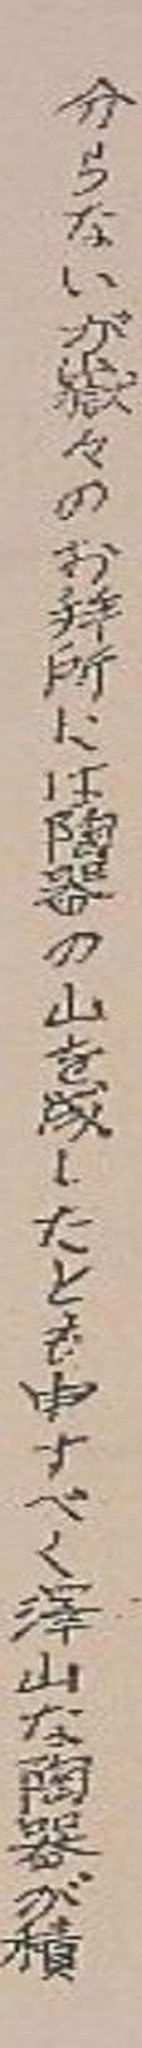分らないが嶽々のお拝所には陶器の山を成したとも申すべく沢山な陶器が積
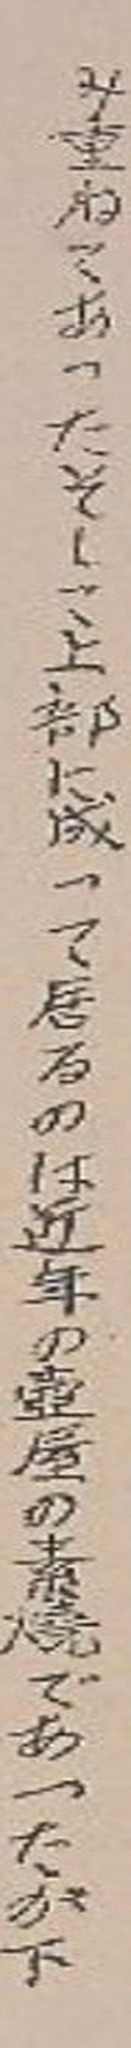み重ねてあつたそして上部に成つて居るのは近年の壺屋の素焼であつたが下
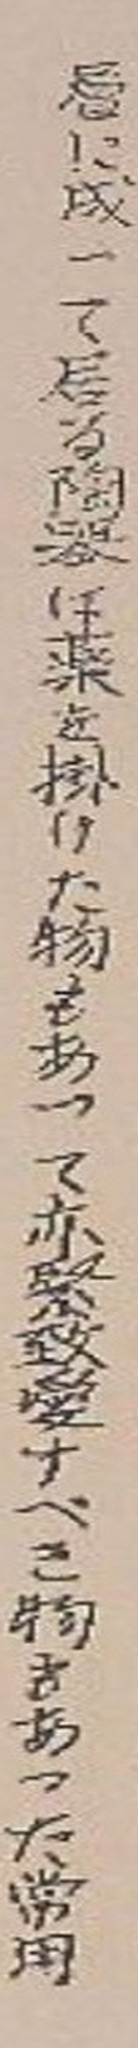層に成つて居る陶器は薬を掛けた物もあつて亦緊致愛すべき物もあつた常用
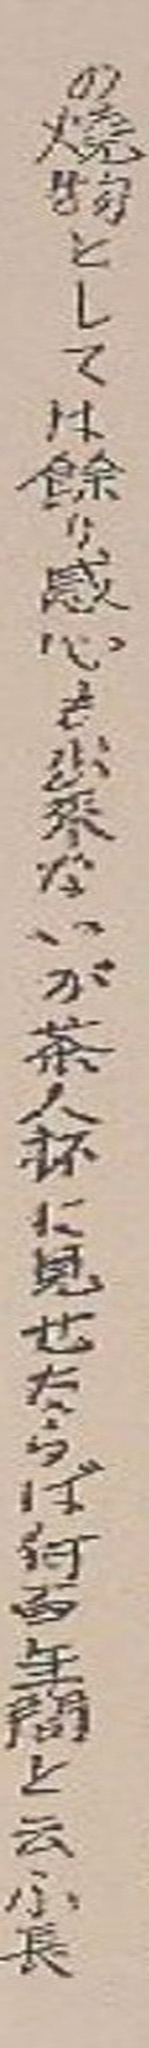の焼物としては余り感心も出来ないが茶人杯に見せたらば何百年間と云ふ長
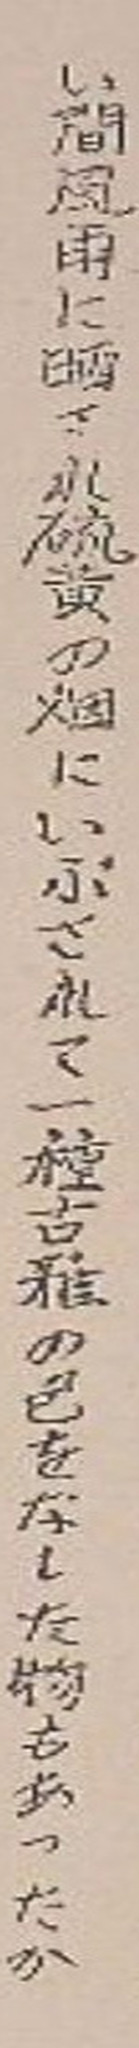い間風雨に晒され硫黄の煙にいぶされて一種古雅の色をなした物もあつたか
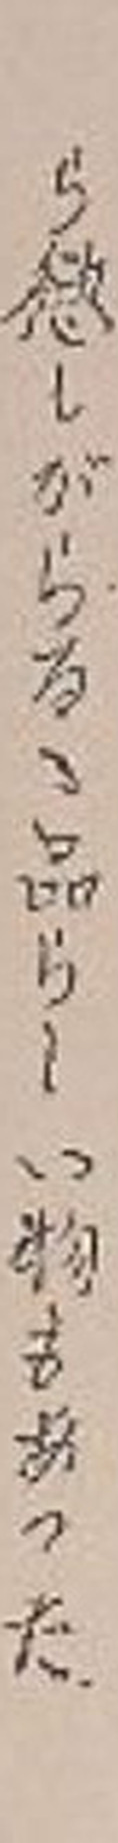ら欲しがらるゝ品らしい物もあつた
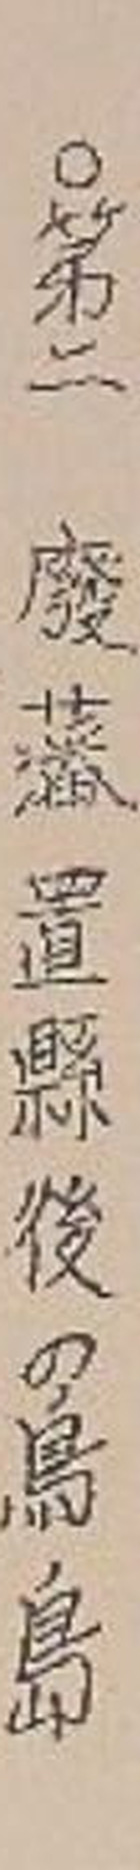○第二廃藩置県後の鳥島
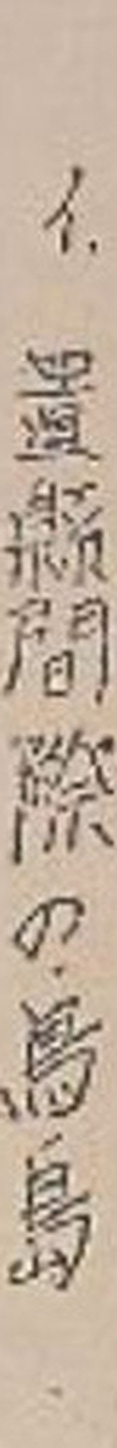イ．置県間際の鳥島
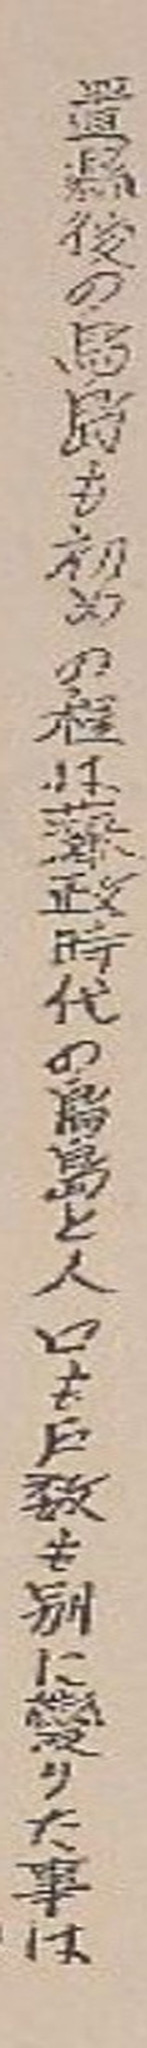置県後の鳥島も初めの程は藩政時代の鳥島と人口も戸数も別に変りた事は
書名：鳥島移住始末
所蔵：University of the Ryukyus Library
